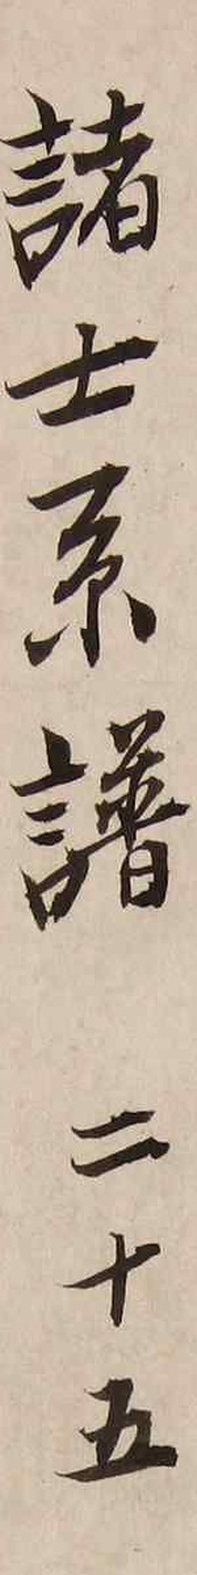諸士系譜二十五

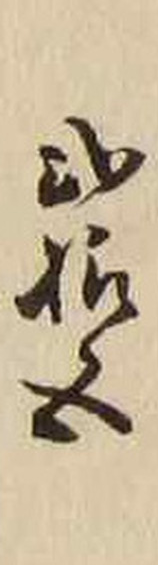弐拾五
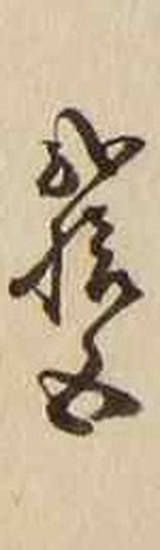弐拾五

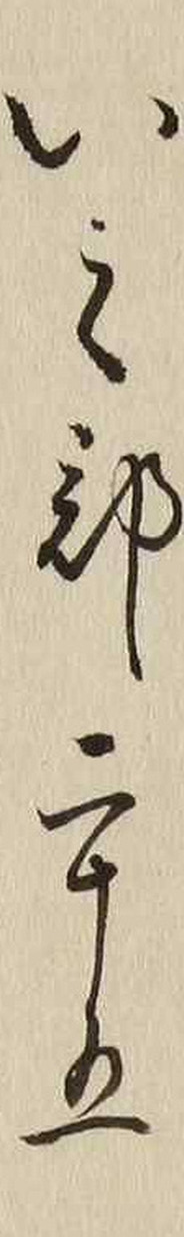い之部二十五
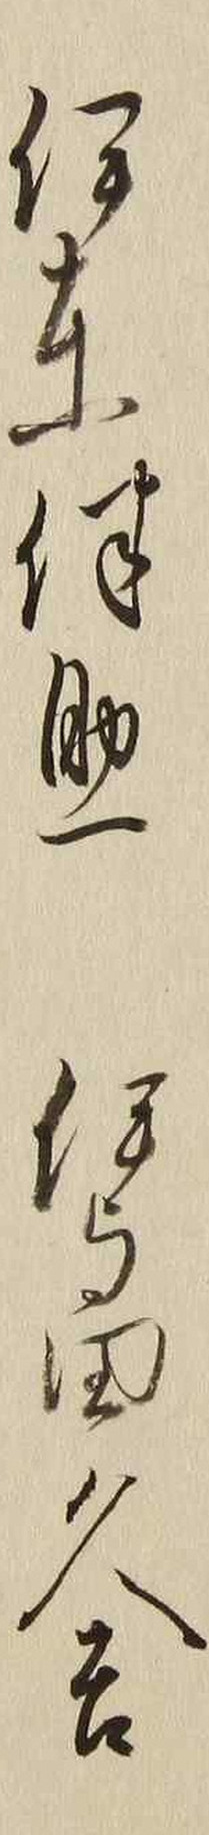伊東伴助一伊与田久吉

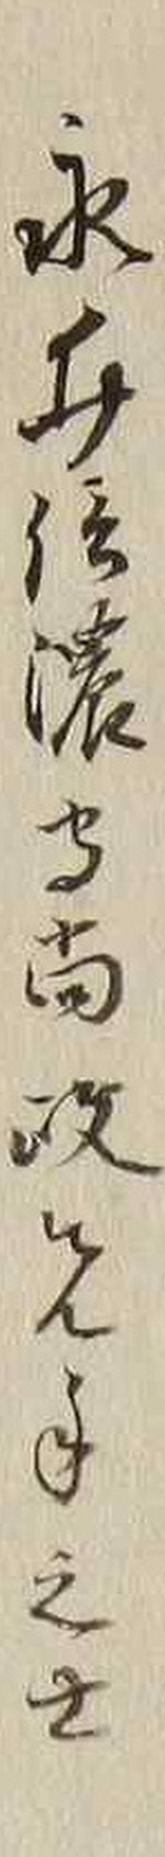永井信濃守尚政先手之士
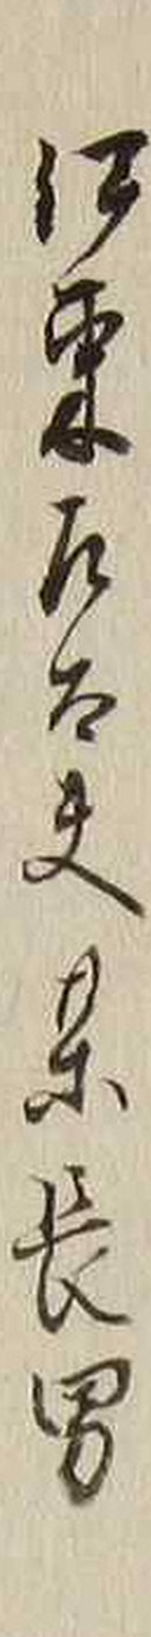伊東左太夫某長男
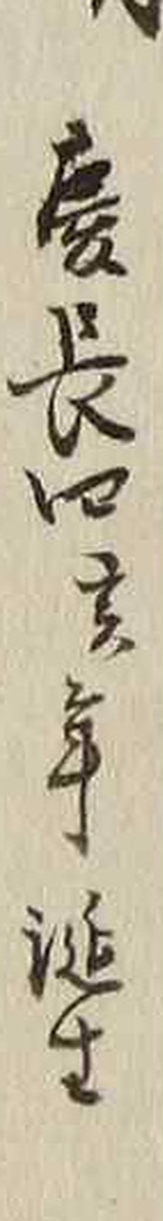慶長四亥年誕生
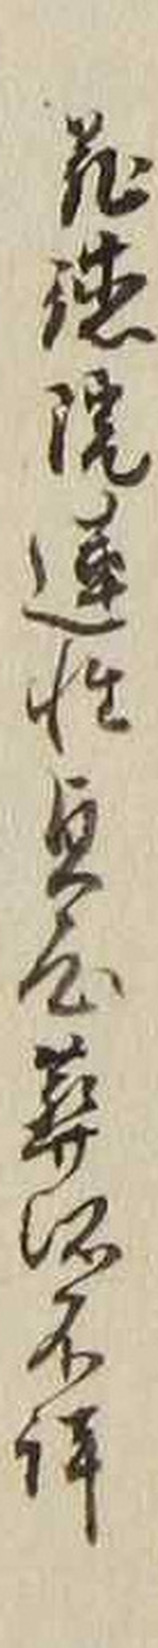花徳院蓮性貞心葬所不祥
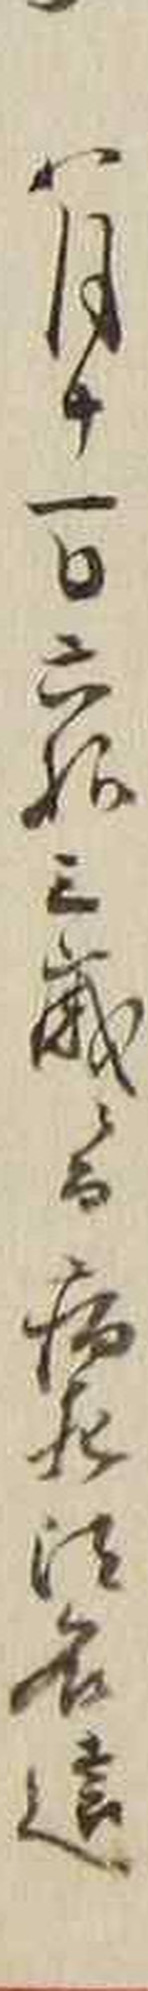八月十一日六拾三歳ニ而病死法名遠
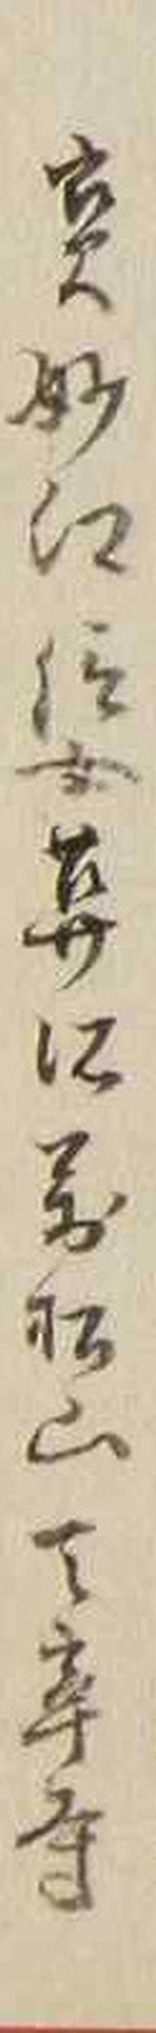実妙江信女葬所万松山天寧寺
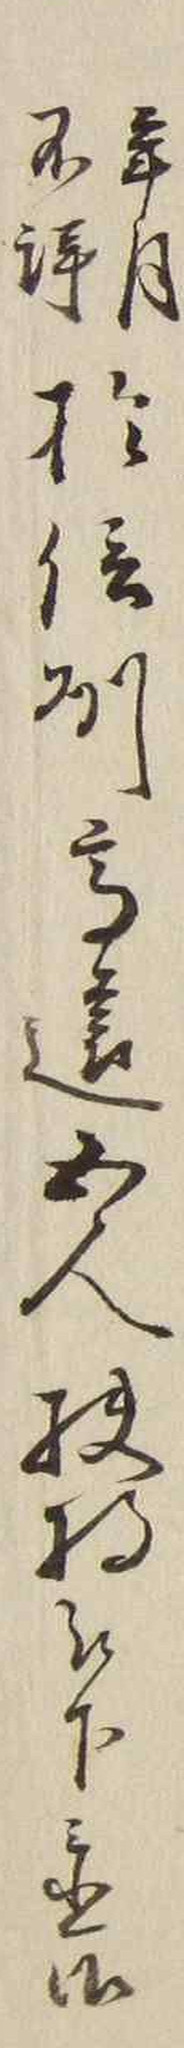不詳於信州高遠五人扶持被下置御

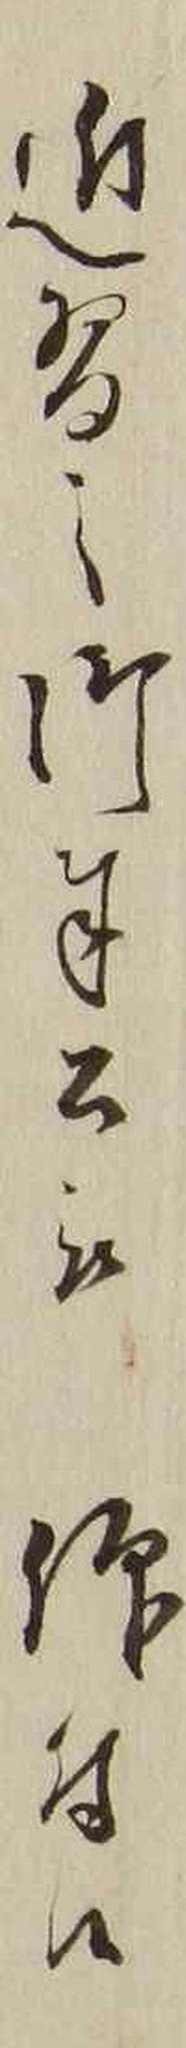近習之御奉公被仰付候
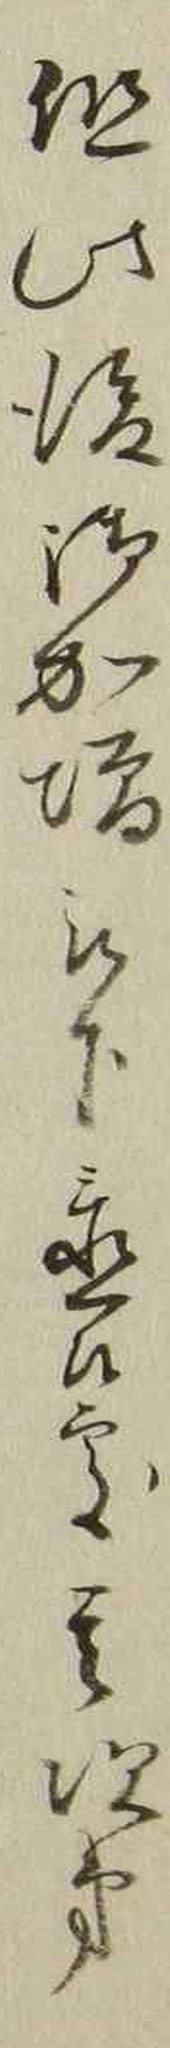但此後御加増被下置候処其次第
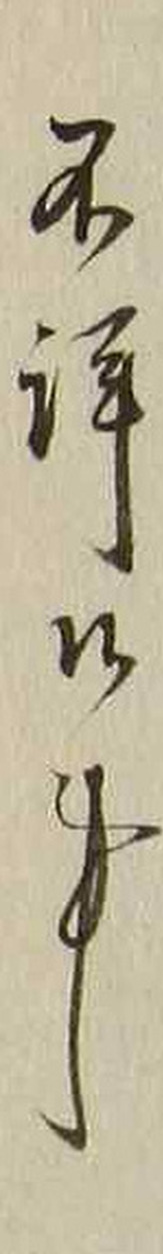不拝候事
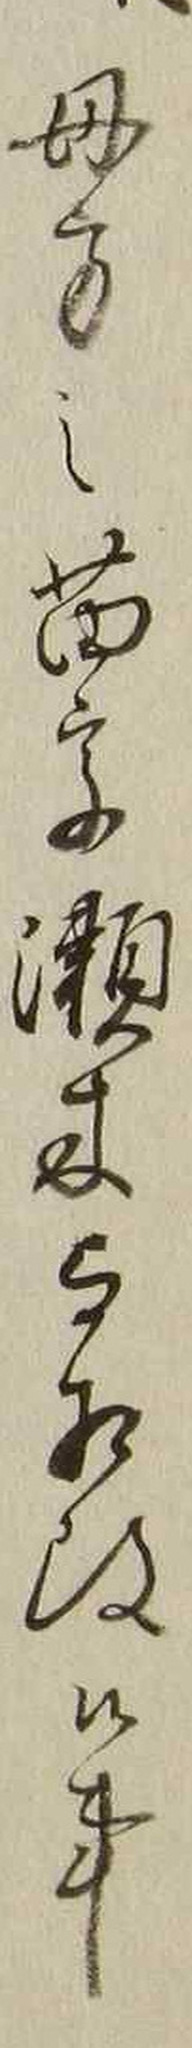不詳母方之苗字瀬木与相改候事
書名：諸士系譜　巻之25　い之部25
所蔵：会津若松市立会津図書館
